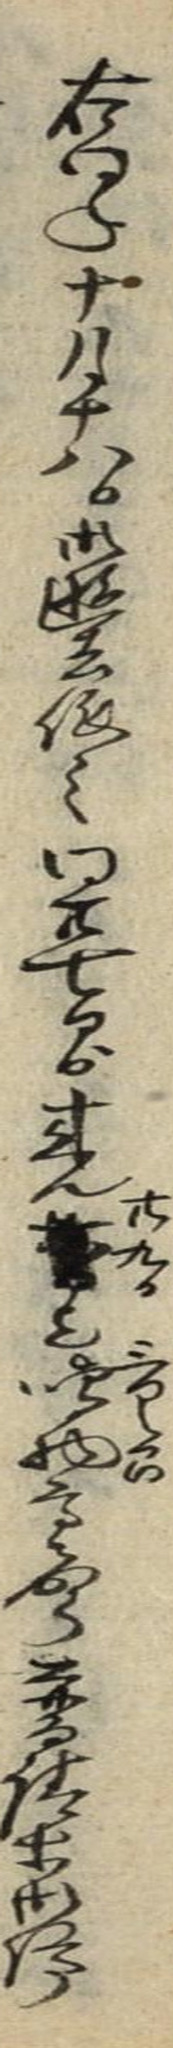右同年十月十八日御逝去依之同廿七日ゟ来ル廿九日迄◦鳴物三日之間高声普請等御停
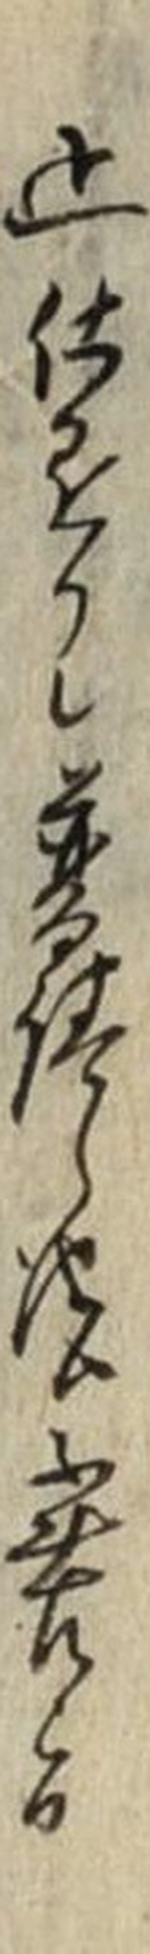止仕懸り候普請之儀は不苦旨
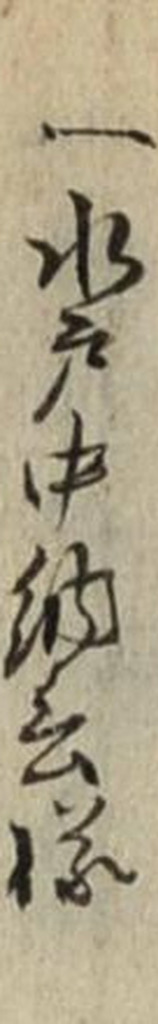一水戸中納言様
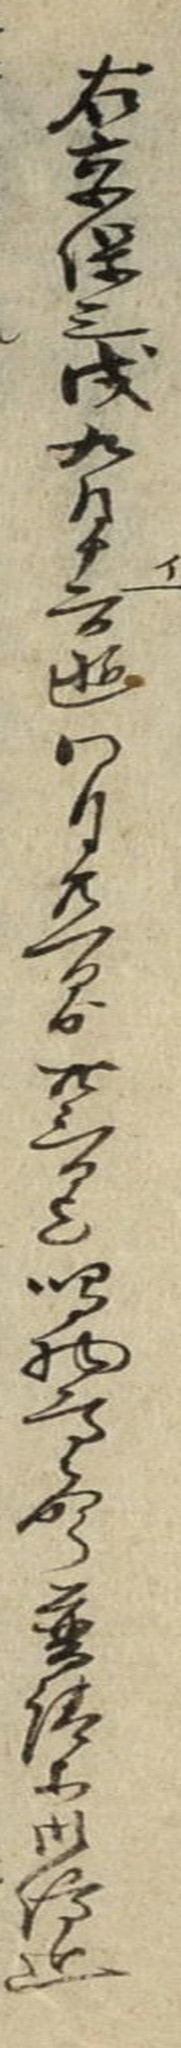右享保三戌九月十二日逝同月廿一日ゟ廿三日迄鳴物高声普請等御停止
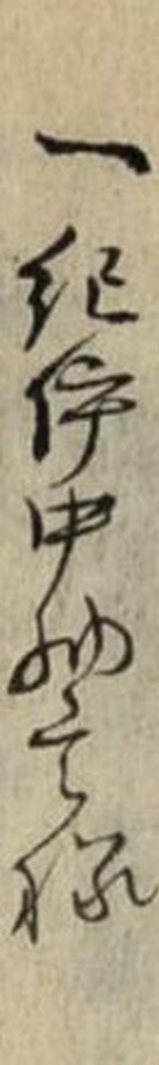一紀伊中納言様
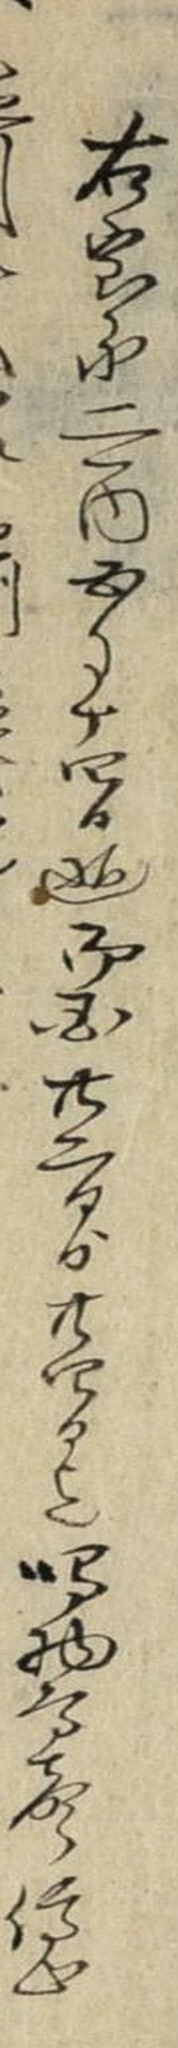右宝永二酉五月十四日逝御国廿二日ゟ廿四日迄鳴物高声停止
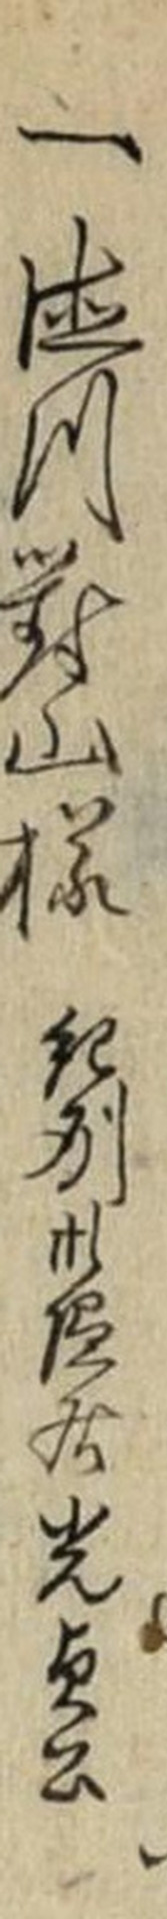一徳川対山様紀州御隠居光貞公
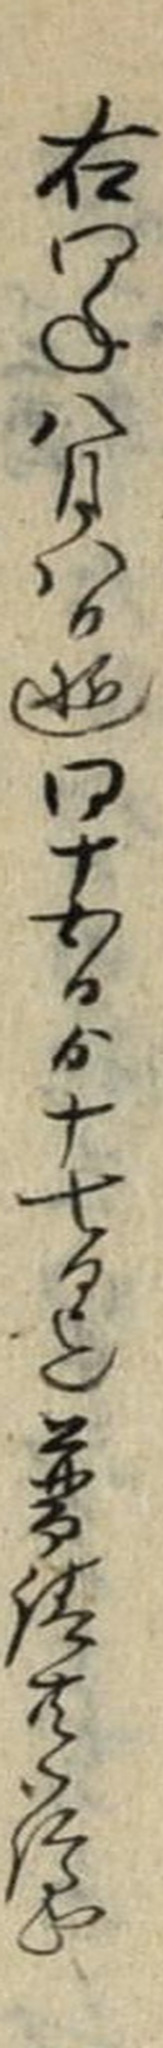右同年八月八日逝同十五日ゟ十七日迄普請共御停止
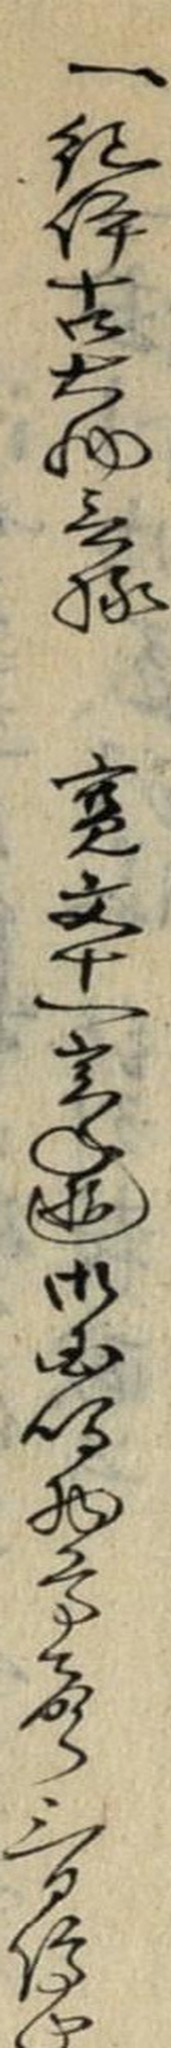一紀伊古大納言様寛文十一亥年逝御国鳴物高声三日停止
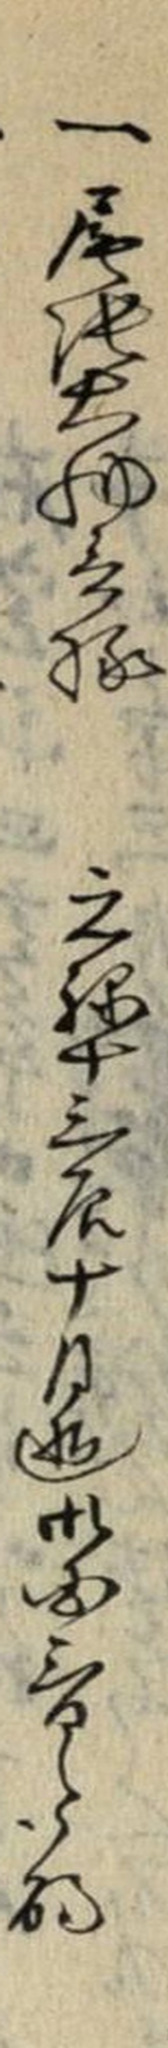一尾張大納言様元禄十三辰十月逝御国三日之御触
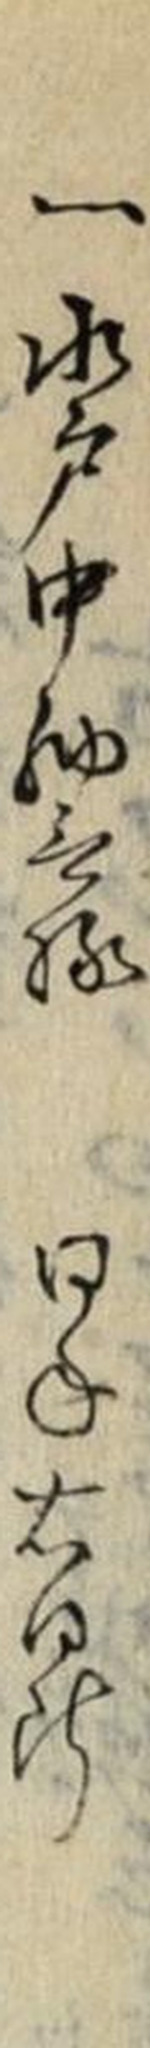一水戸中納言様同年右同断
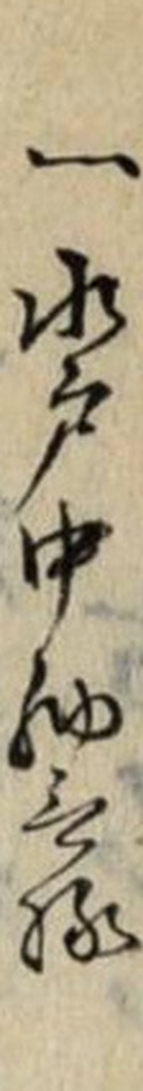一水戸中納言様
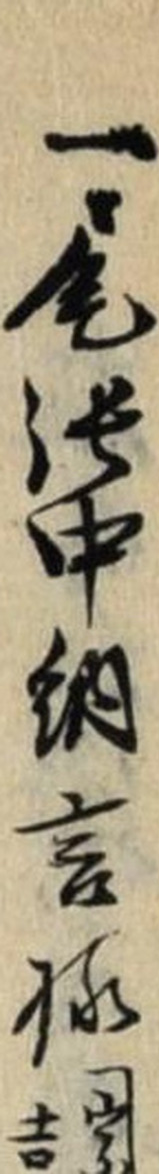一水戸中納言様
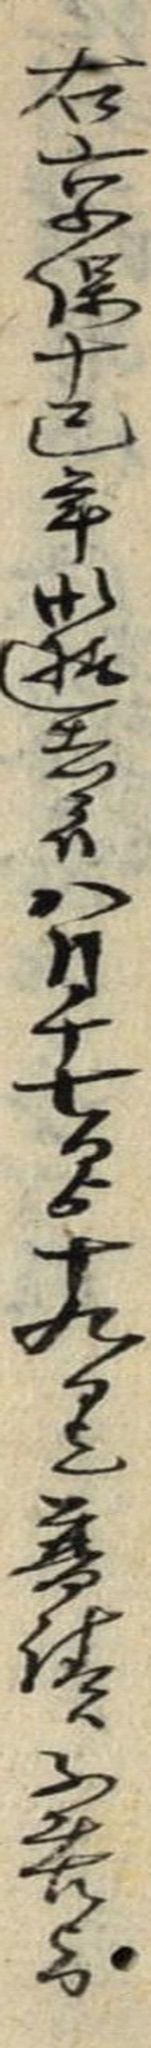右享保十巳年御逝去に付八月十七日ゟ十九日迄普請は不苦旨
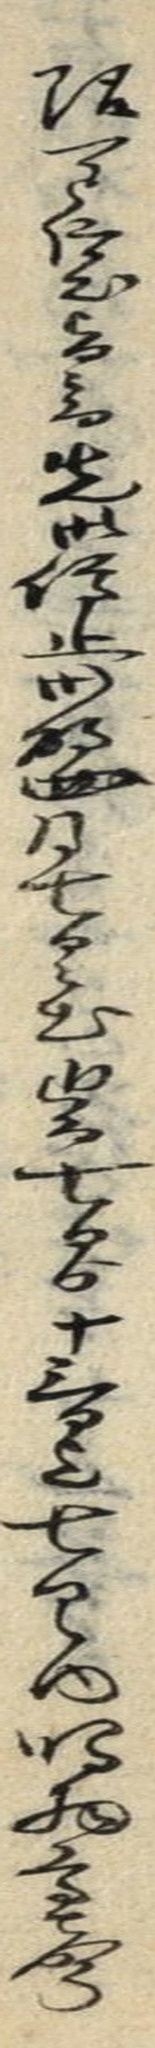限可被仰出旨にて先御停止御触四月七日に出追て七日ゟ十三日迄七日之内鳴物高声
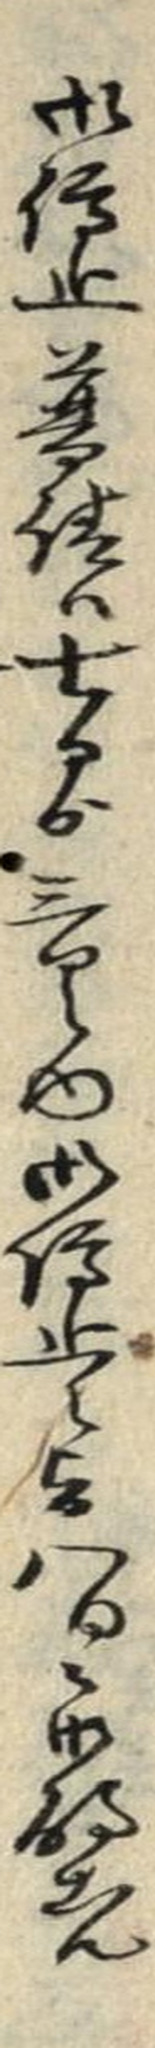御停止普請は七日ゟ三日之内御停止之旨八日に御触出ル
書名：御停止異変死失
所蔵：福井県文書館 Fukui Prefectural Archives
